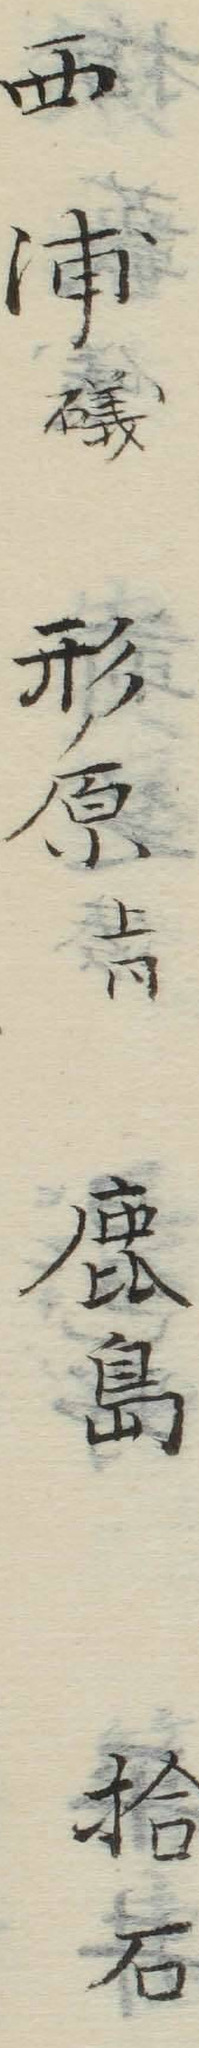西浦礒形原上同鹿島拾石
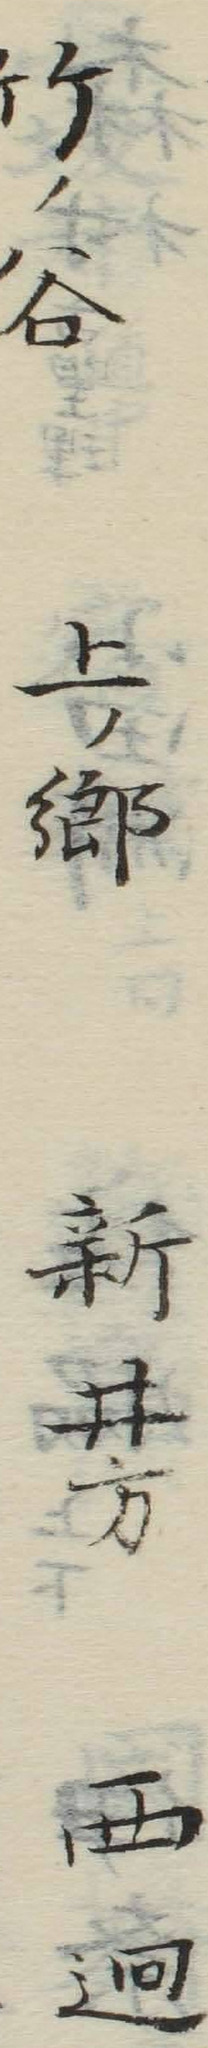竹ノ谷上ノ郷新井方西迥
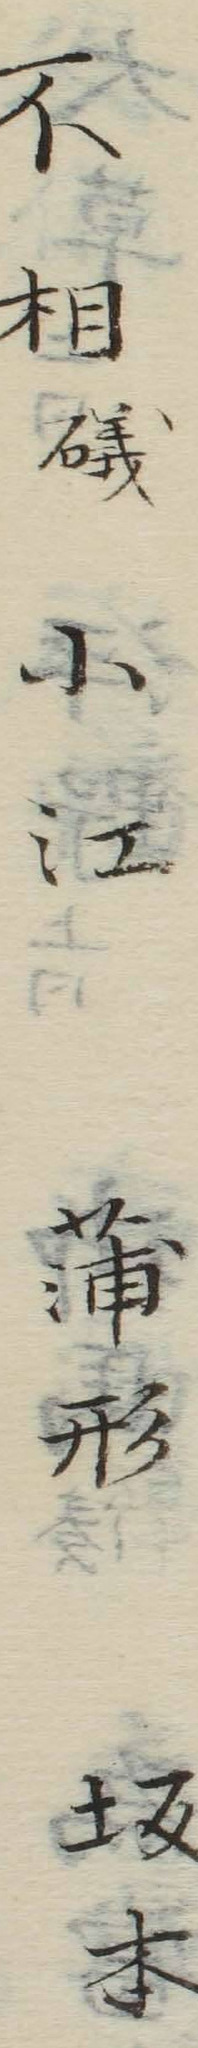不相礒小江蒲形坂本
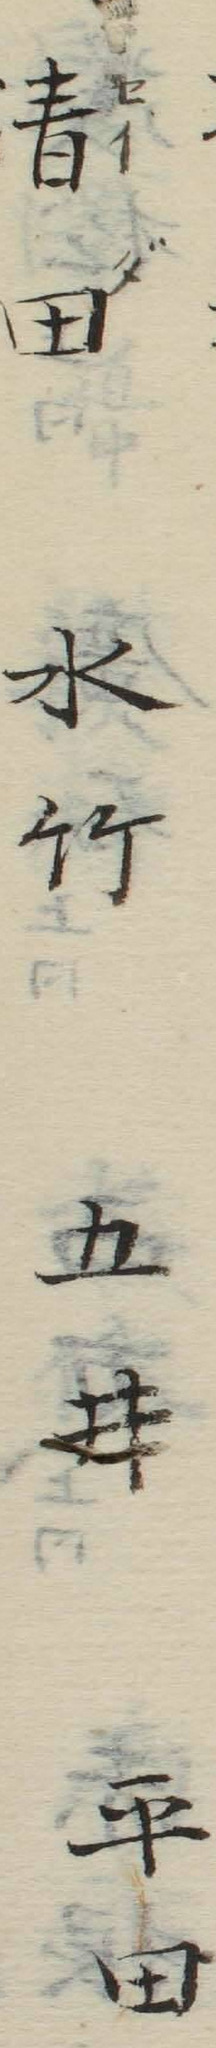清田水竹五井平田

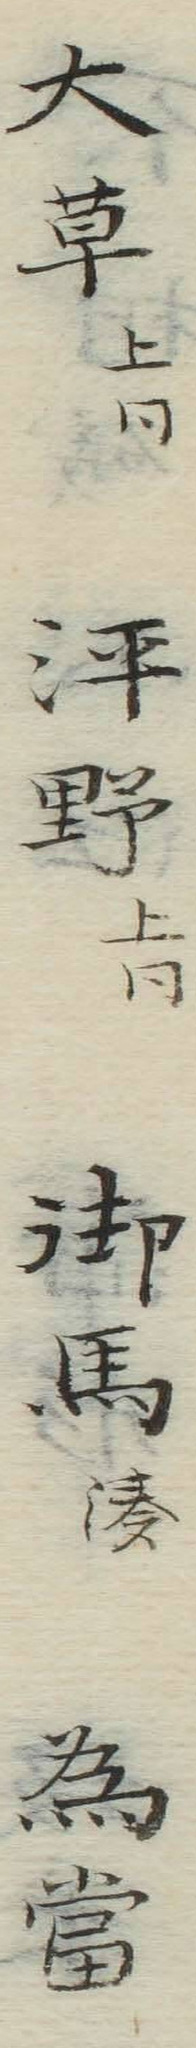大草上同泙野上同御馬湊為當
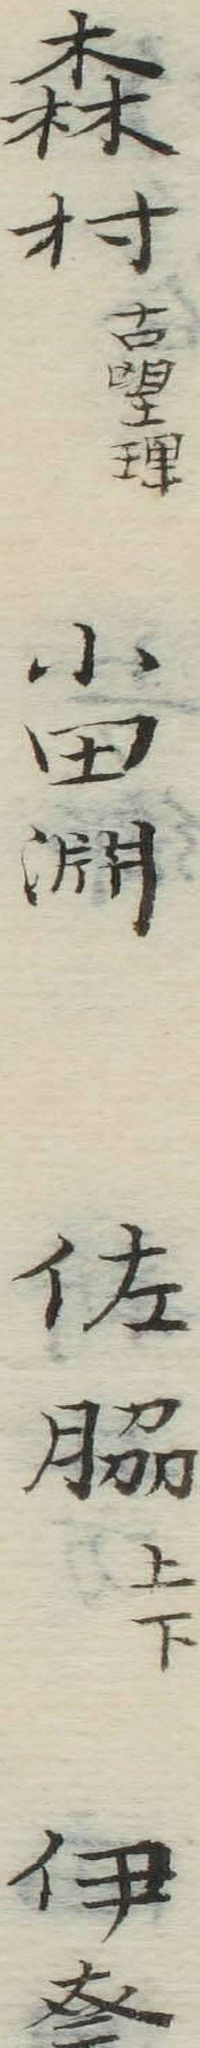森村故望理小田淵佐脇上下伊奈
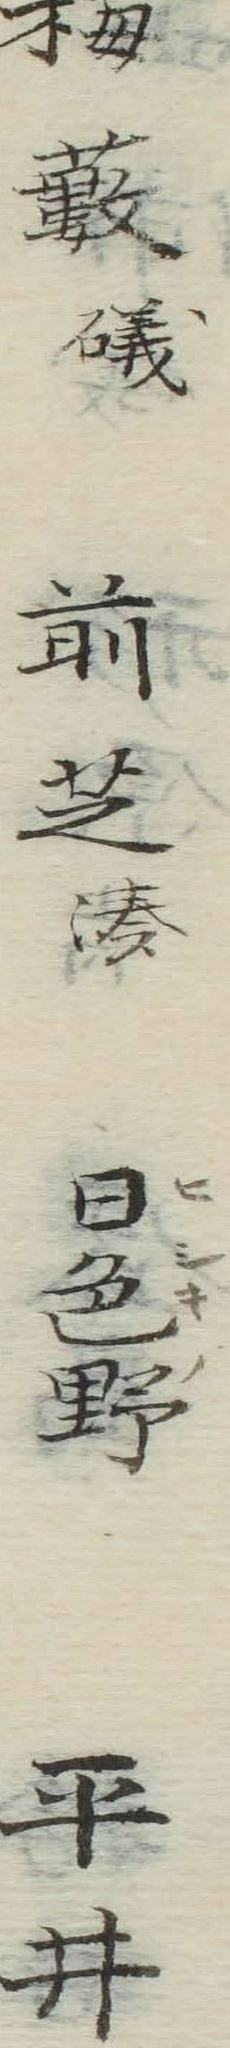梅藪礒前芝湊日色野平井
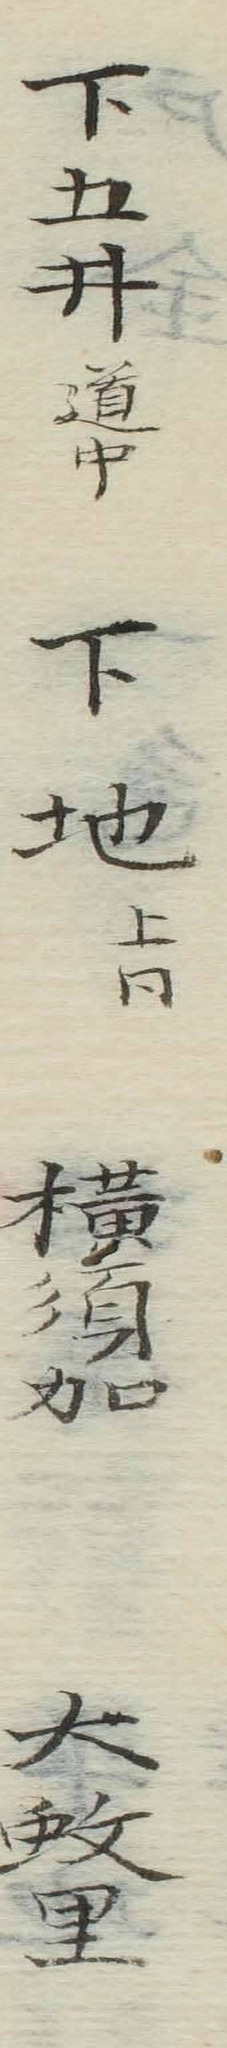下五井道中下地上同横須加大里
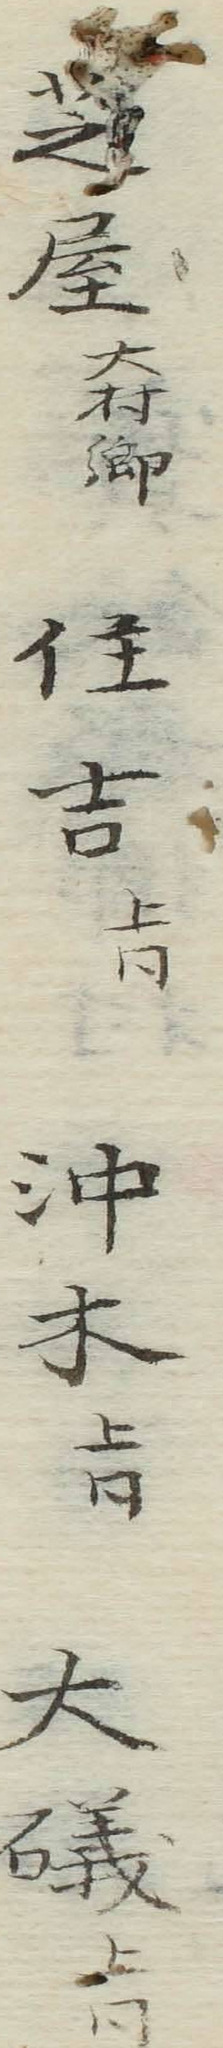芝屋大村郷住吉上同沖木上同大礒上同
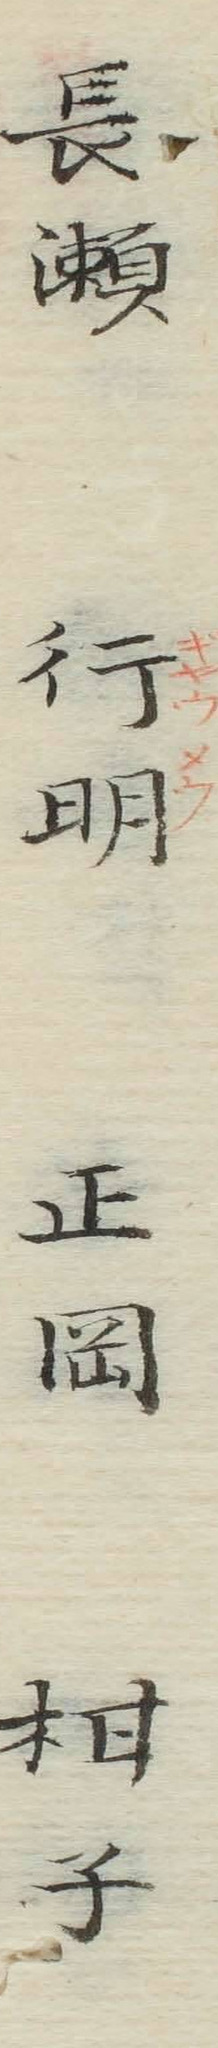長瀬行明正岡子
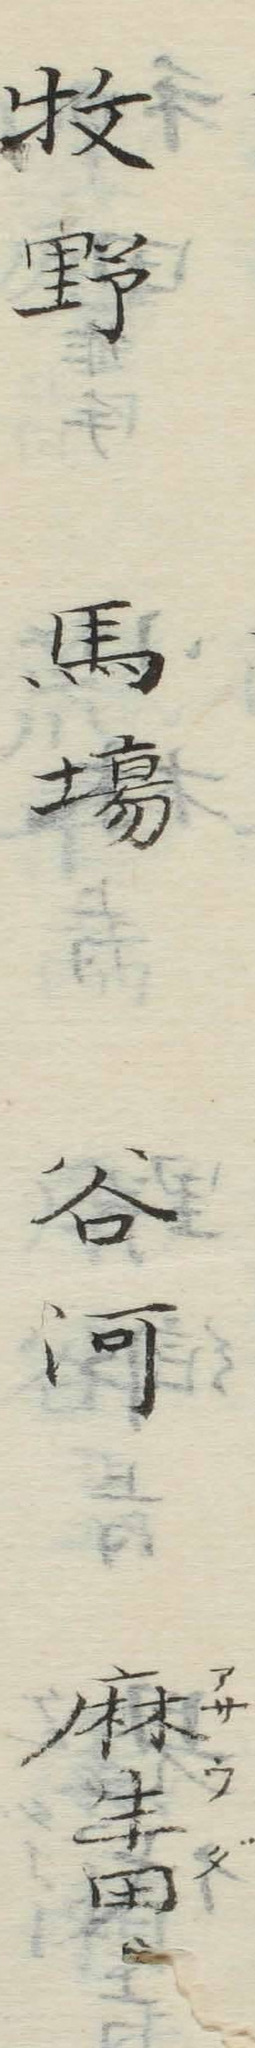牧野馬場谷河麻生田
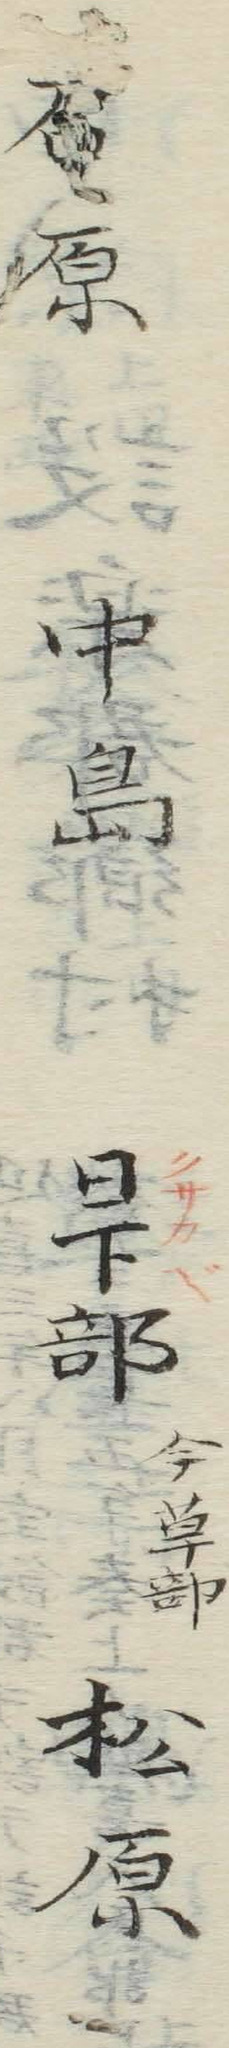石原中島日下部今草部松原
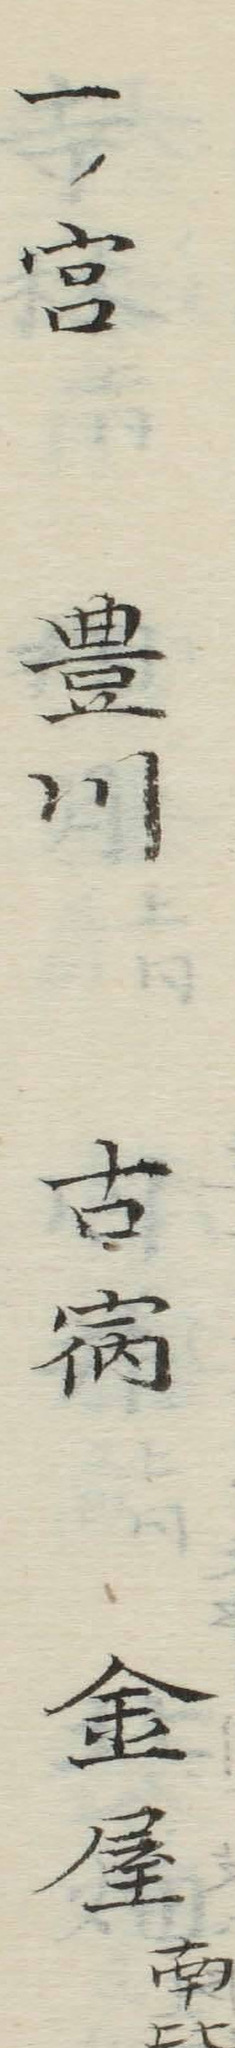一ノ宮豊川古宿金屋南北
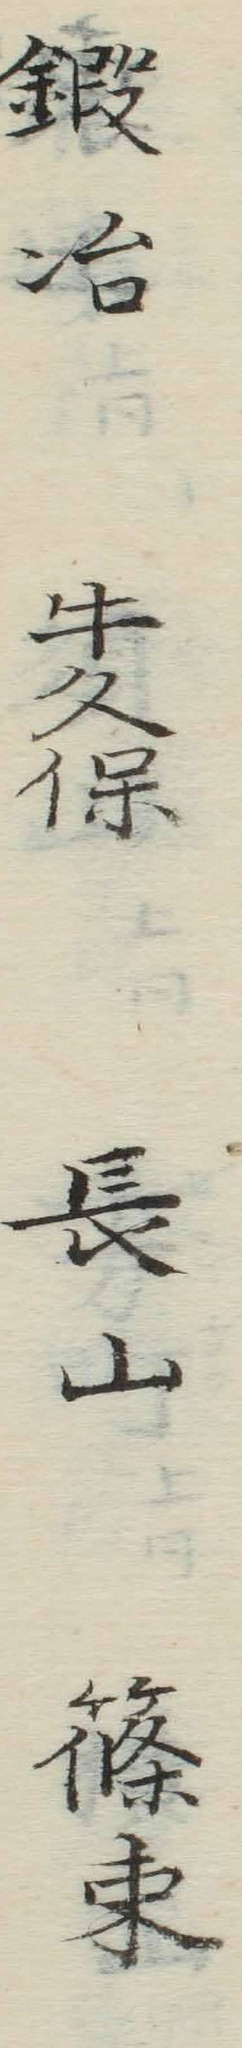鍛冶牛久保長山篠束
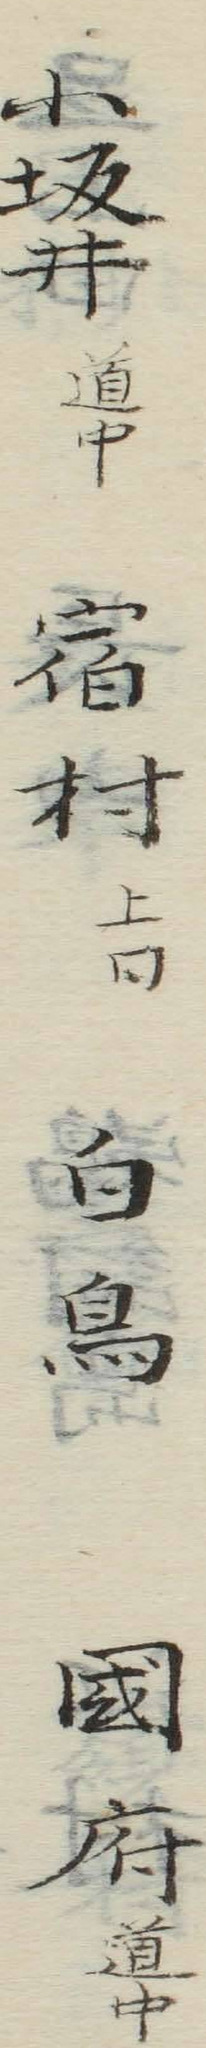小坂井道中宿村上同白鳥國府道中
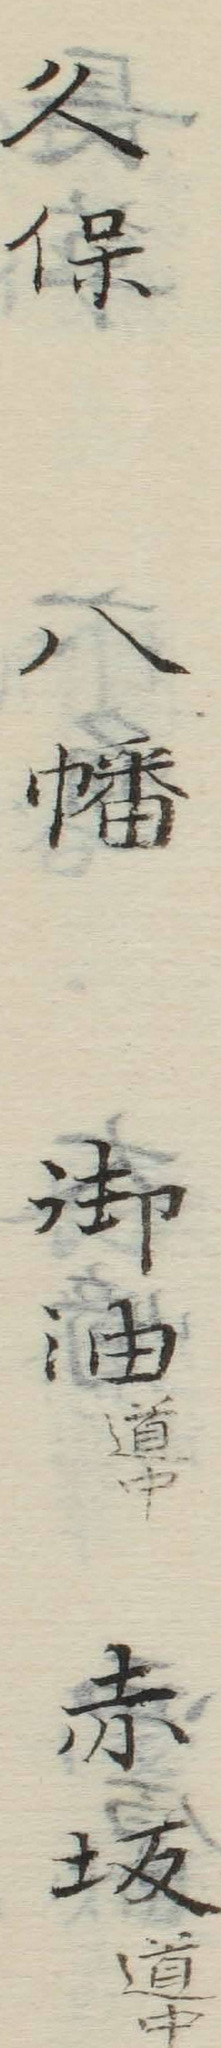久保八幡御油道中赤坂道中
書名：三河国二葉松
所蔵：国文学研究資料館
